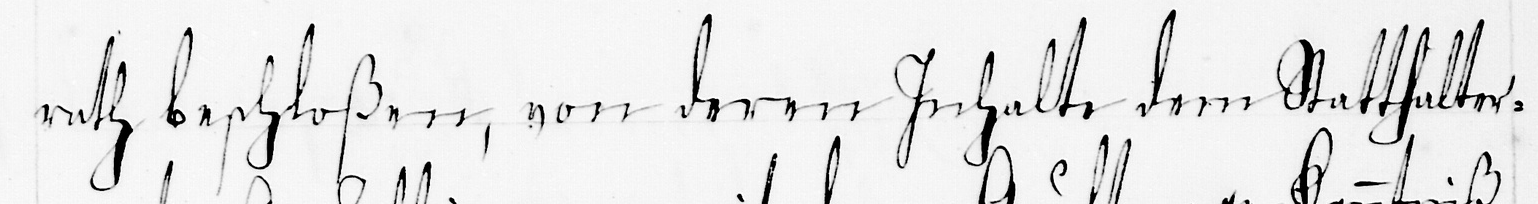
rath beschloßen, von deren Inhalte dem Statthalt¬
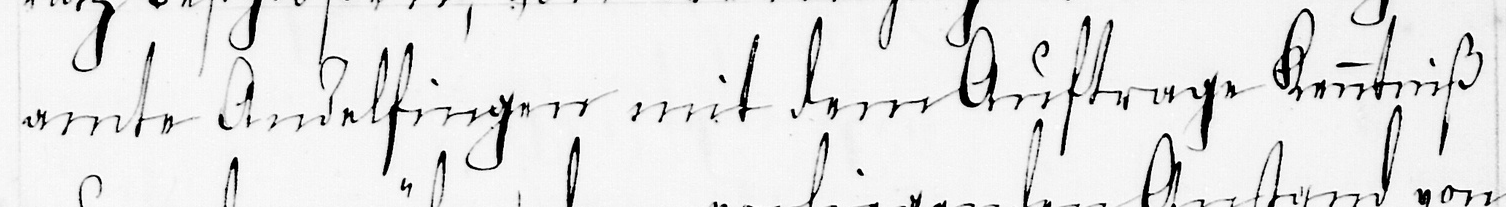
amte Andelfingen mit dem Auftrage Kenntniß
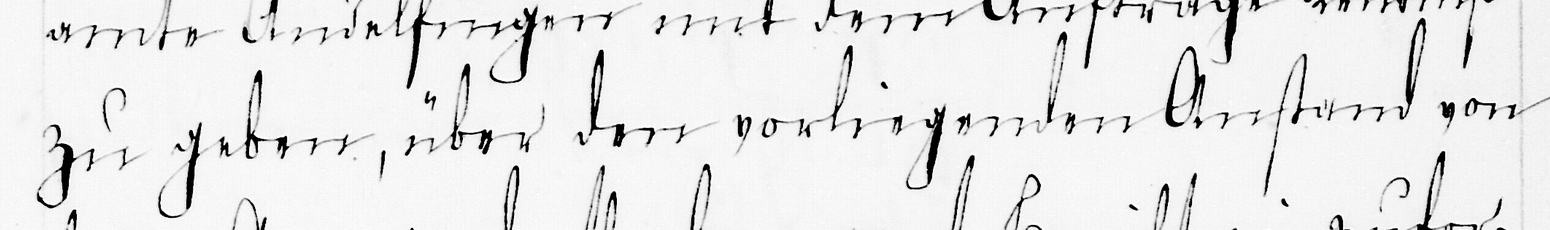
zu geben, über den vorliegenden Anstand von
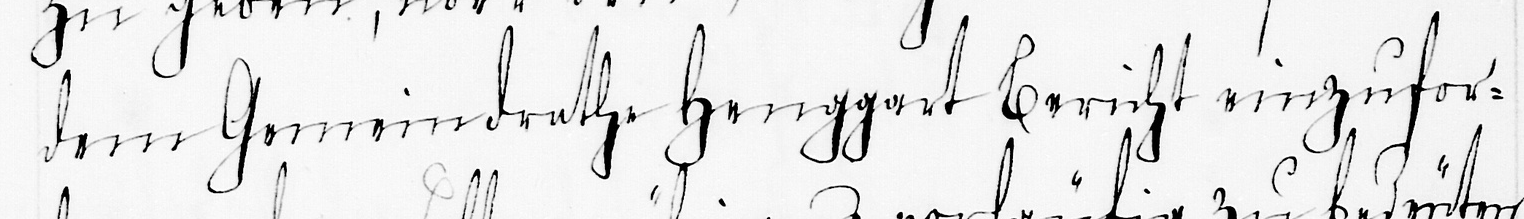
dem Gemeindrathe Henggart Bericht einzufor¬
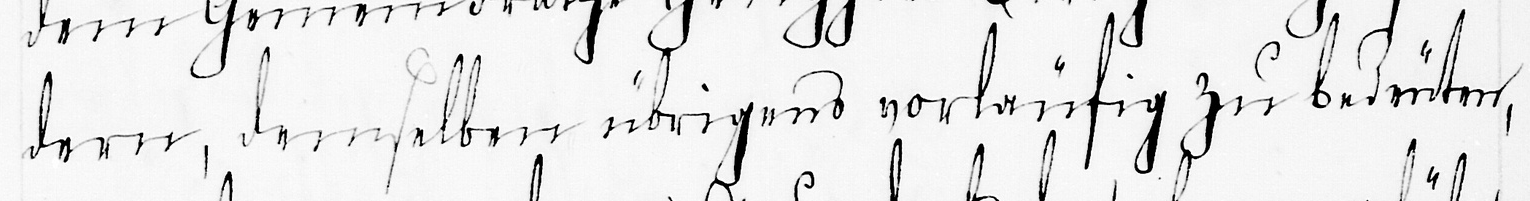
dern, demselben übrigens vorläufig zu bedeuten,
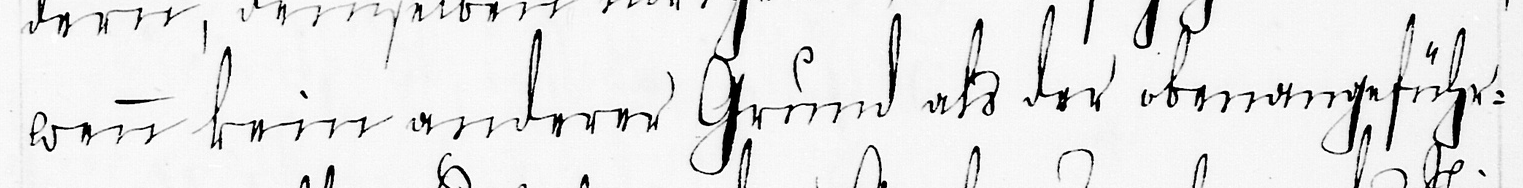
wenn kein anderer Grund als der obenangeführ¬
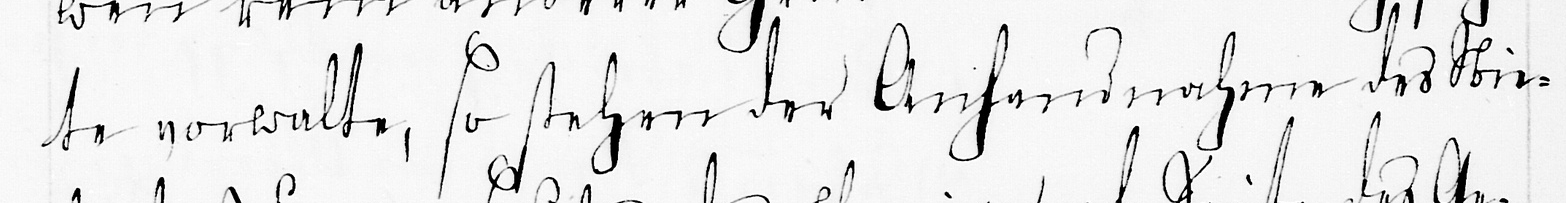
te vorwalte, so stehen der Anhandnahme des Nie¬
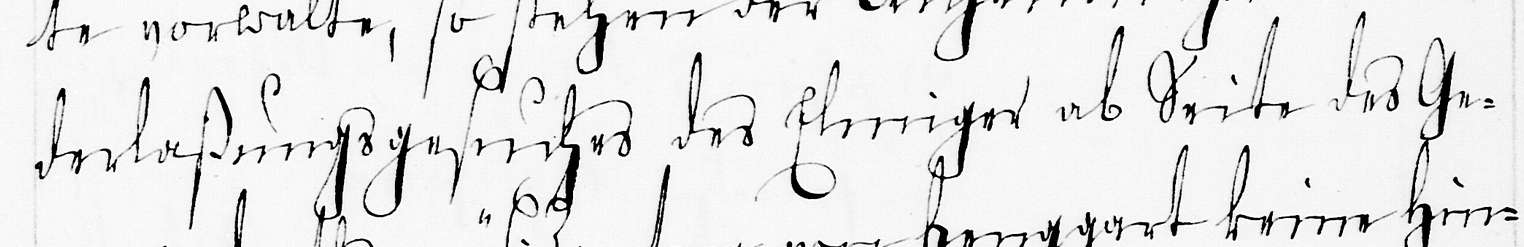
derlaßungsgesuches des Elmiger ab Seite des Ge¬
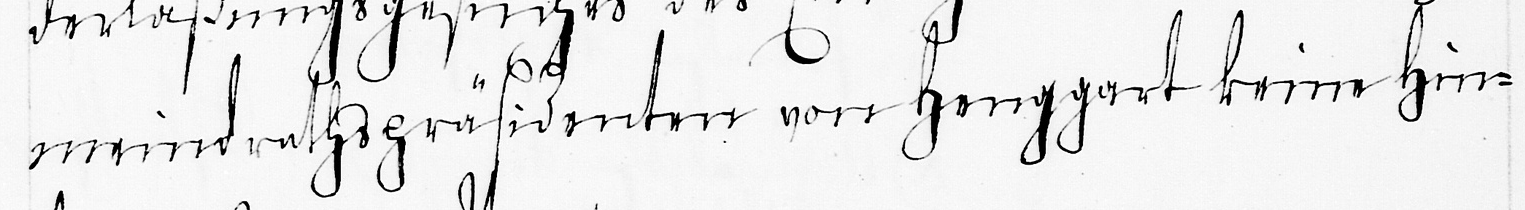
meindrathspräsidenten von Henggart keine Hin¬
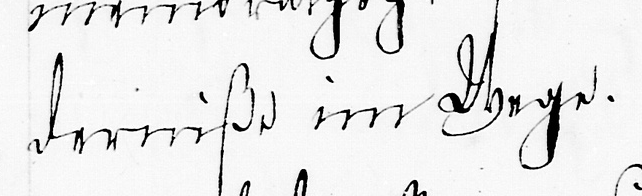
derniße im Wege.
